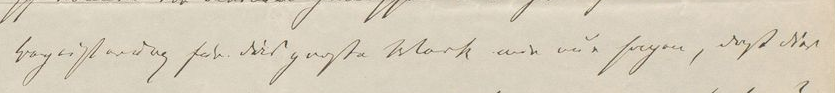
Begeisterung für das große Werk mir nur sagen, daß dies
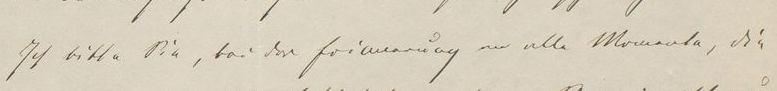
Ich bitte Sie, bei der Erinnerung an alle Momente, die
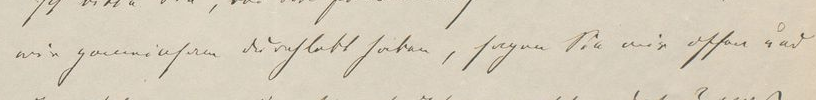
wir gemeinsam durchlebt haben, sagen Sie mir offen und
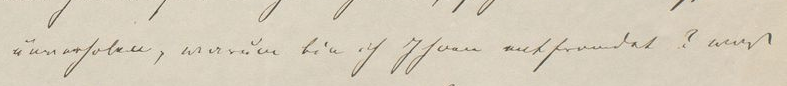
unverholen, warum bin ich Ihnen entfremdet? was
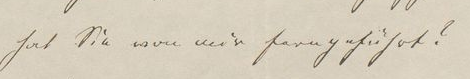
hat Sie von mir ferngeführt?
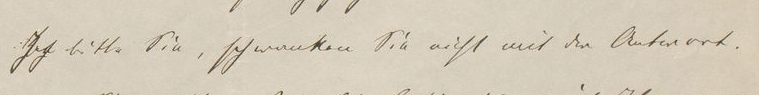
Ich bitte Sie, schwanken Sie nicht mit der Antwort
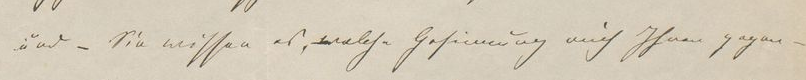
und – Sie wissen es, welche Gesinnung mich Ihnen gegen-
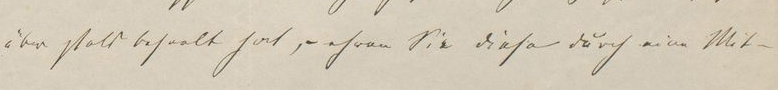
über stets beseelt hat – ehren Sie diese durch eine Mit-
